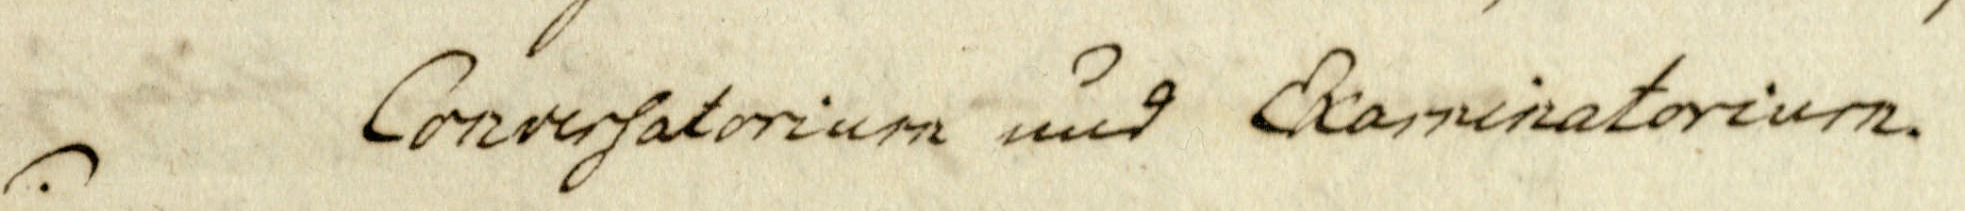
Conversatorium und Examinatorium.
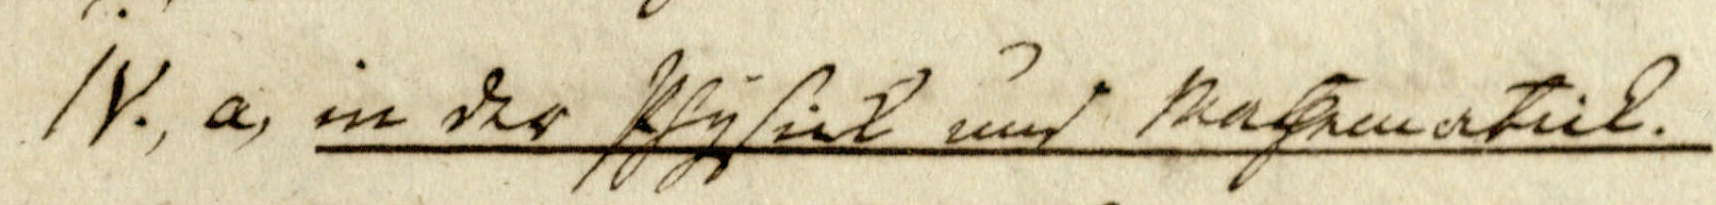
IV., a, in der Phÿsick und Mathematick
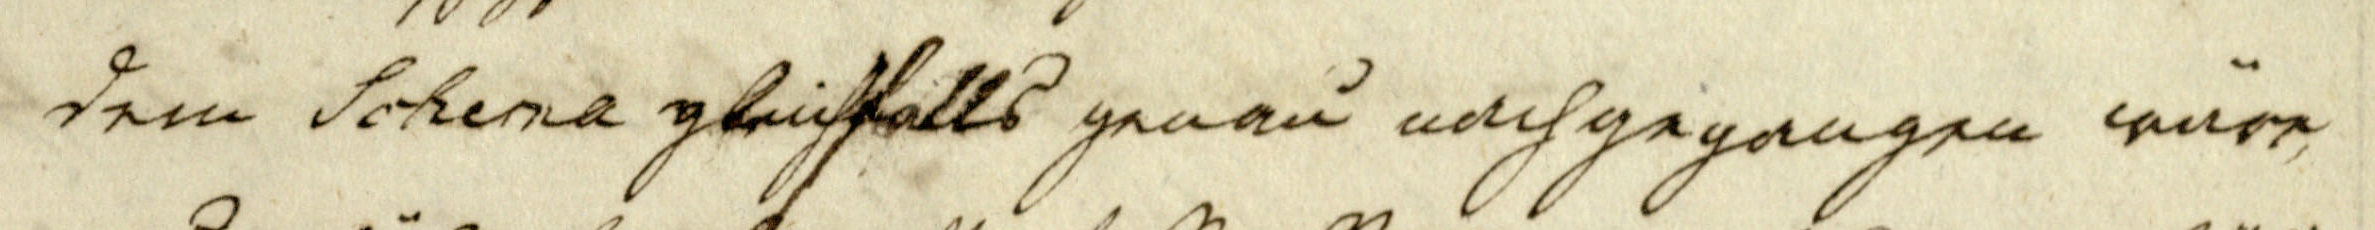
dem Schema gleichfalls genau nachgegangen wäre,
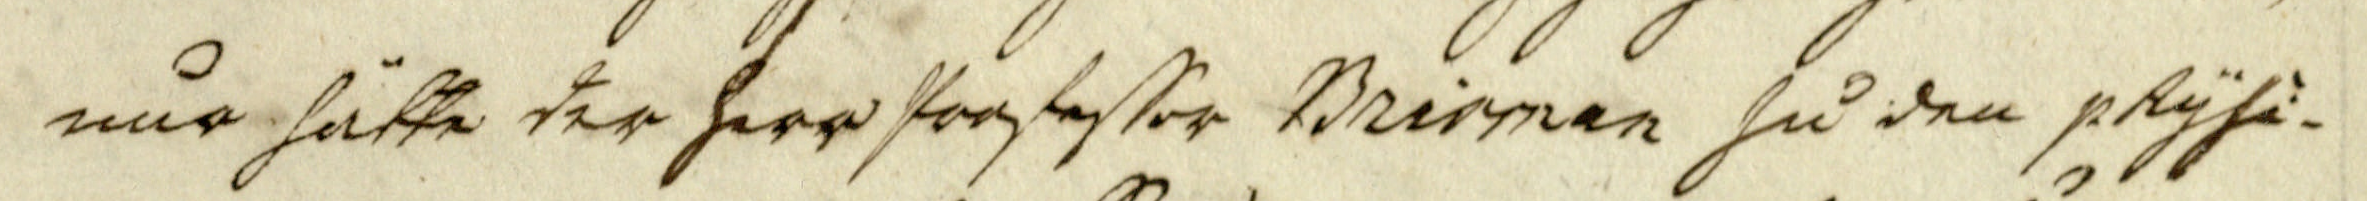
nur hätte der herr Professor Brisman zu den phÿsi¬
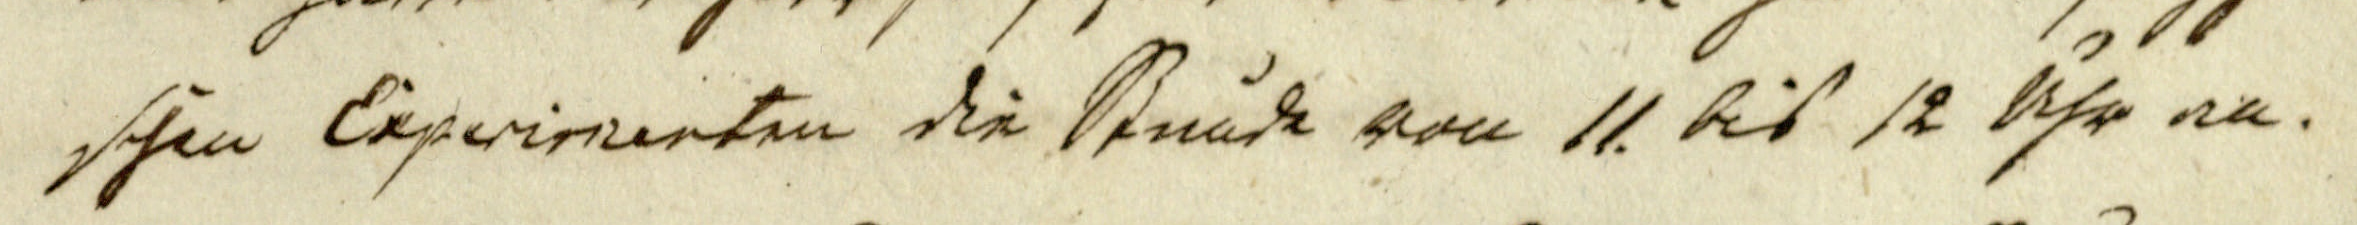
schen Experimenten die Stunde von 11. bis 12 Uhr an¬
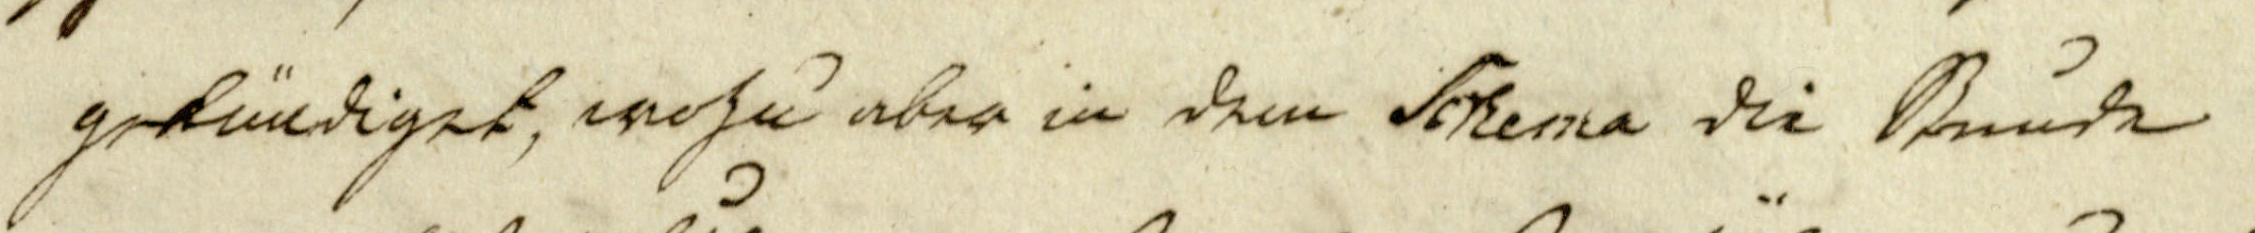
gekündiget, wozu aber in dem Schema die Stunde
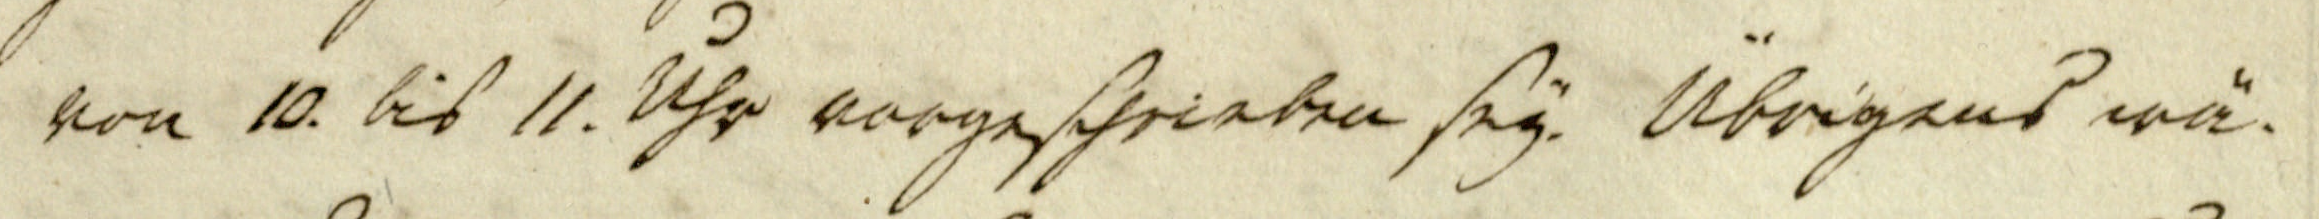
von 10. bis 11. Uhr vorgeschrieben seÿ. Übrigens wä¬
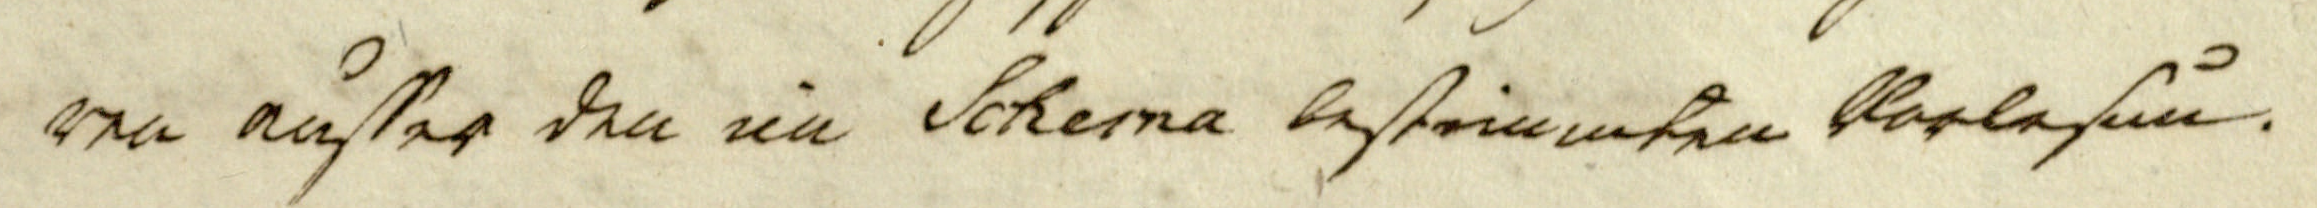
ren außer den im Schema bestimmten Vorlesun¬
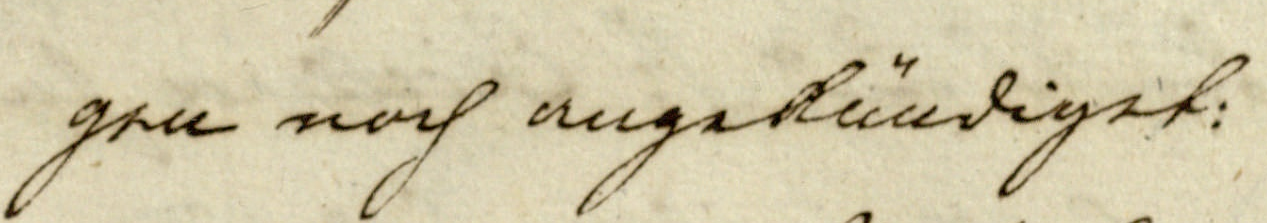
gen noch angekündiget:
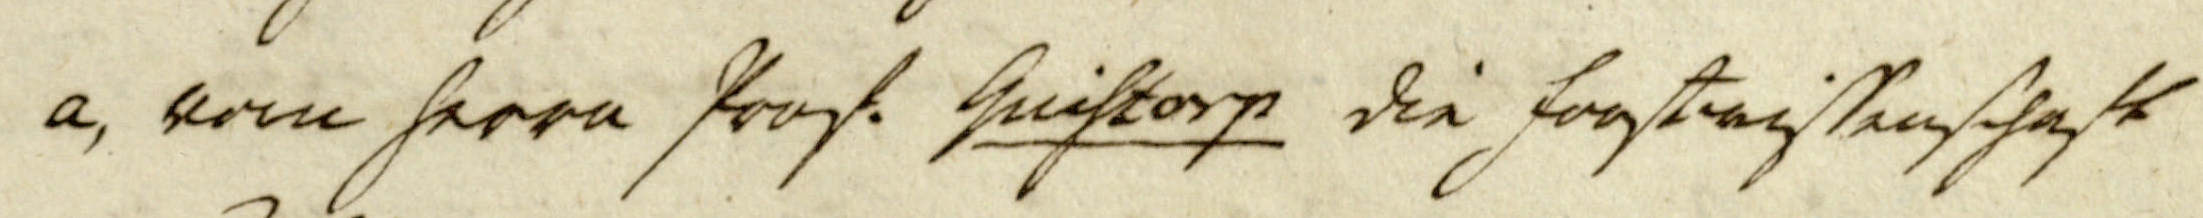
a, vom herrn Prof. Quistorp die Forstwissenschaft
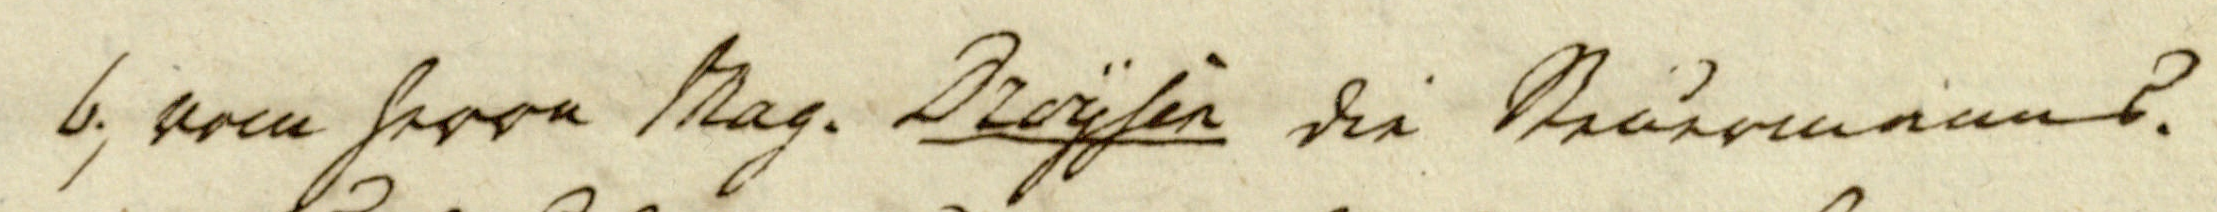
b, vom herrn Mag. Droÿsen die Steuermanns
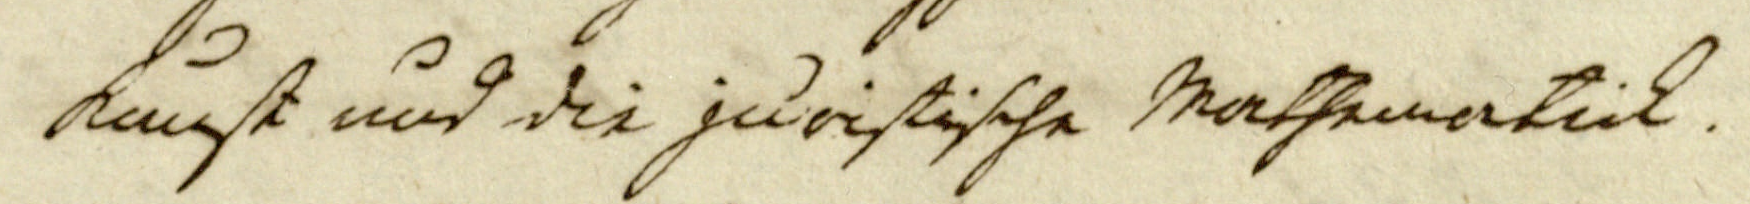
kunst und die juristische Mathematick.
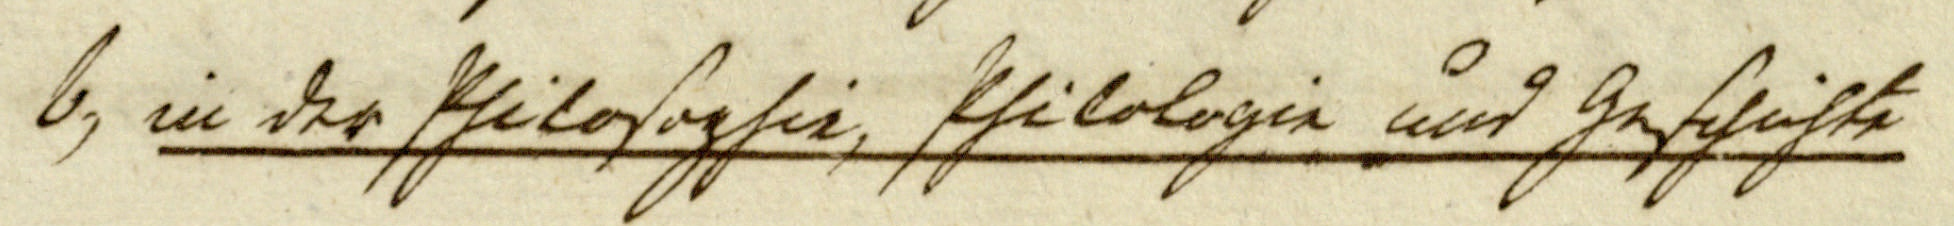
b, in der Philosophie, Philologie und Geschichte
